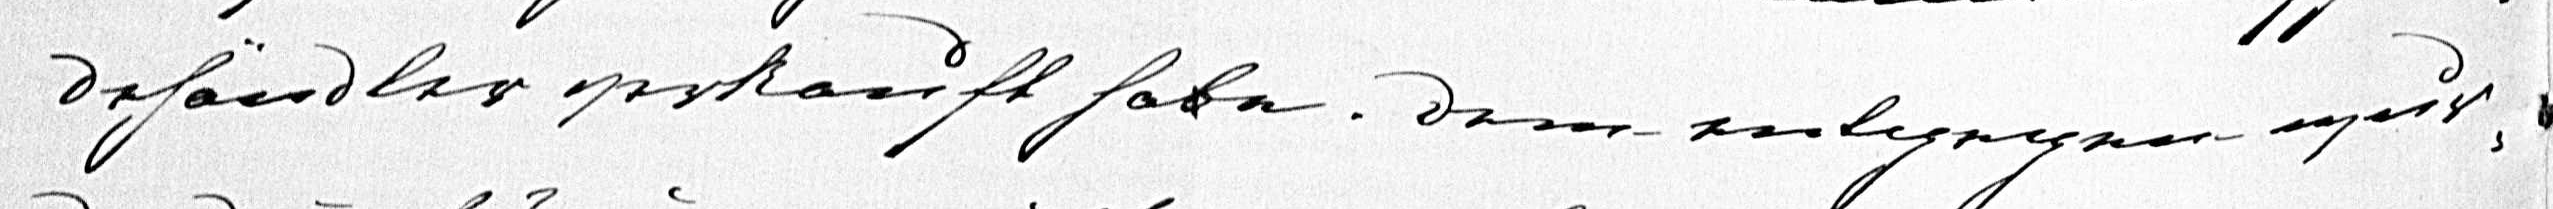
dehändler verkauft habe. Dem entgegen wur¬
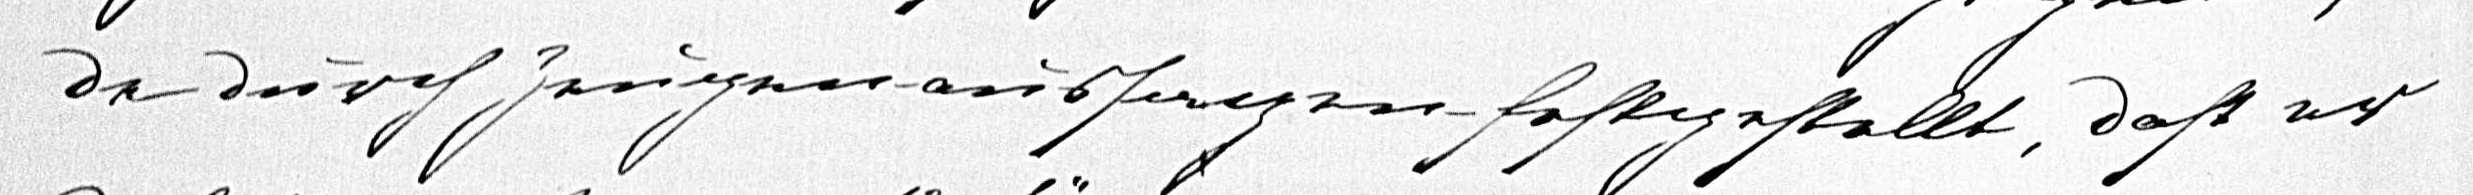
de durch Zeugen aussagen festgestellt, daß er
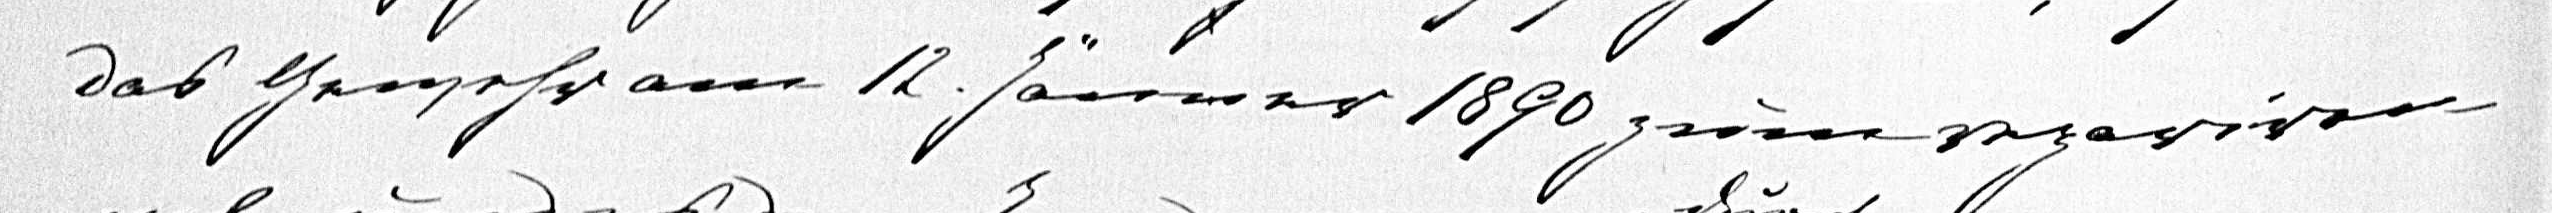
das Gewehr am 12. Jänner 1890 zum repariren
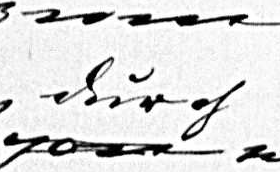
durch
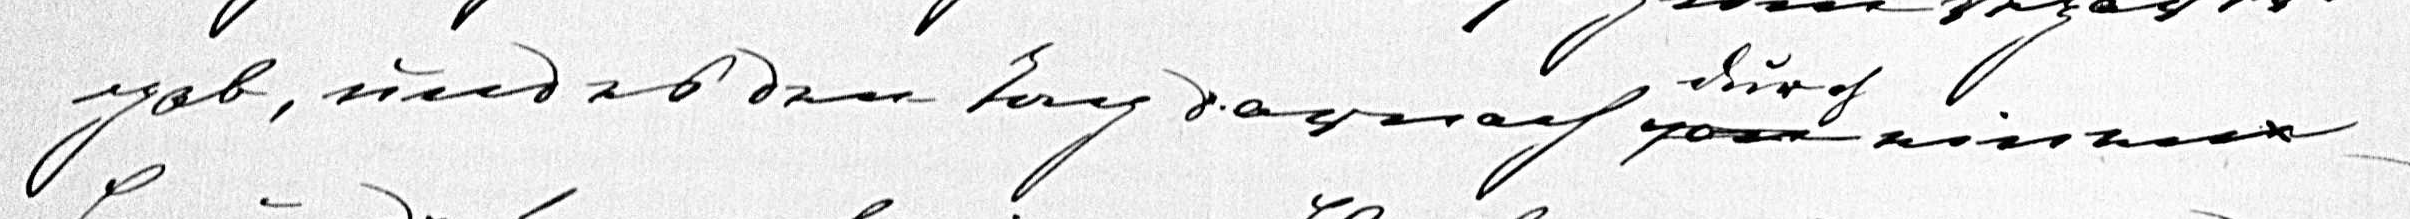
gab, und es den Tag darnach einen
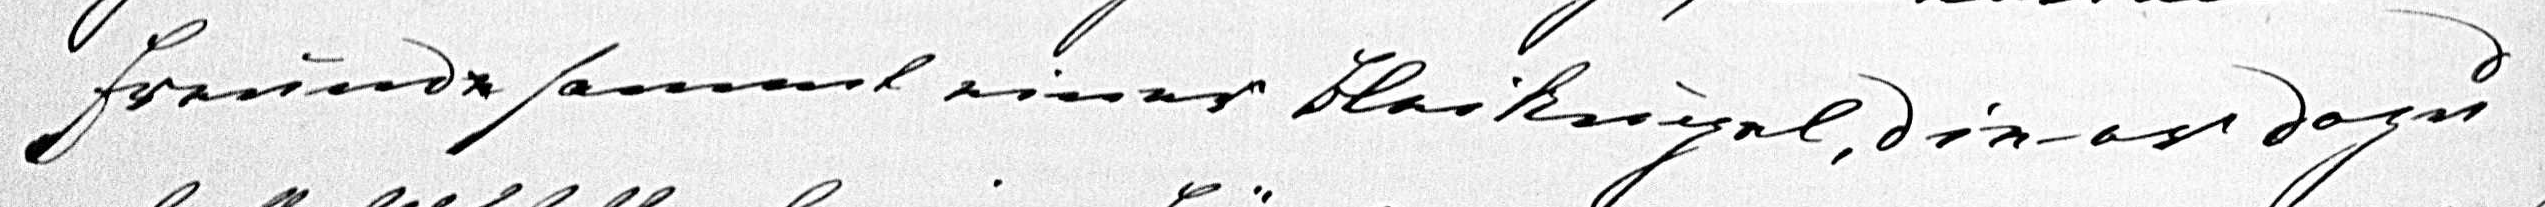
Freunde sammt einer Bleikugel, die er dazu
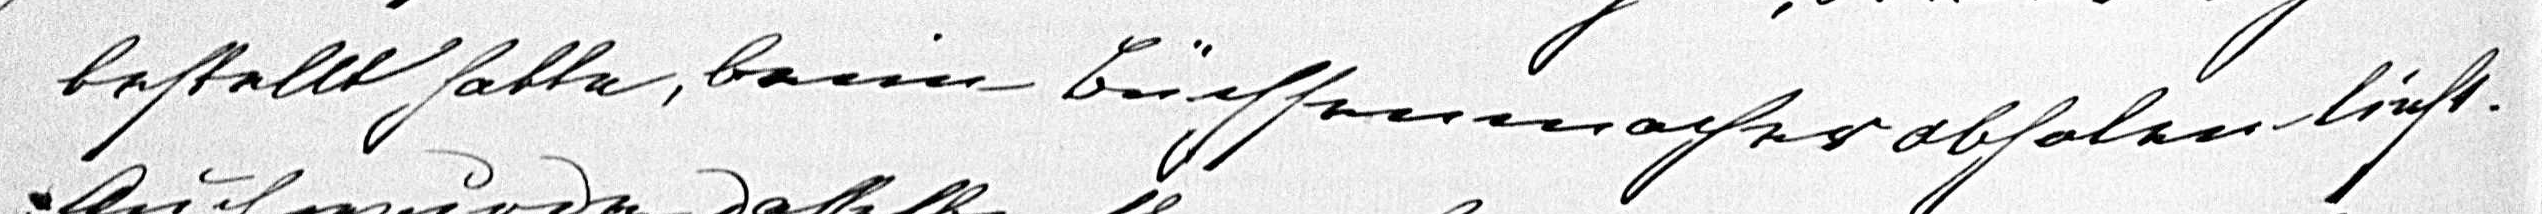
bestellt hatte, beim Büchsenmacher abholen liest.
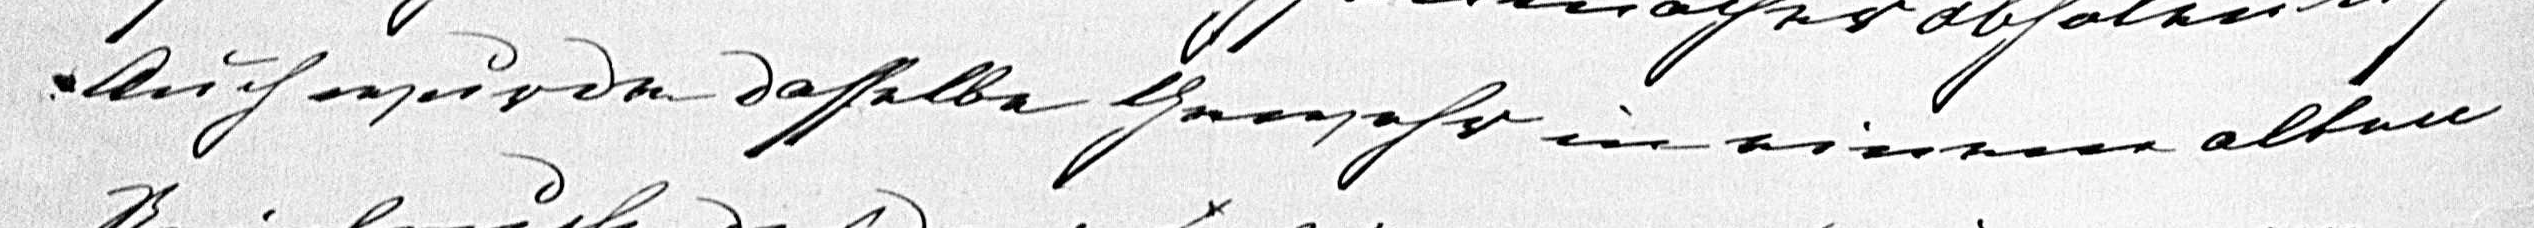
Auch wurden dasselbe Gewehr in einem alten
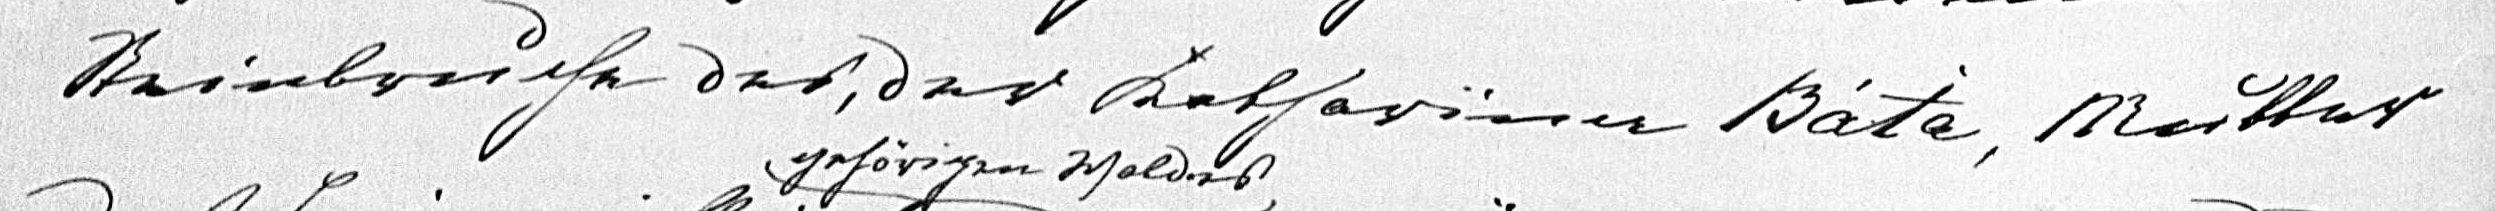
Steinbruche des, der Katharina Báta, Mutter
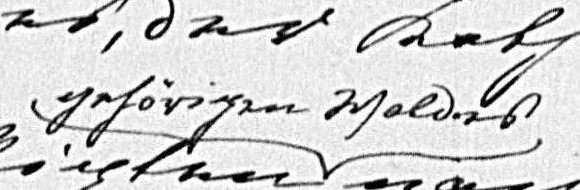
gehörigen Waldes
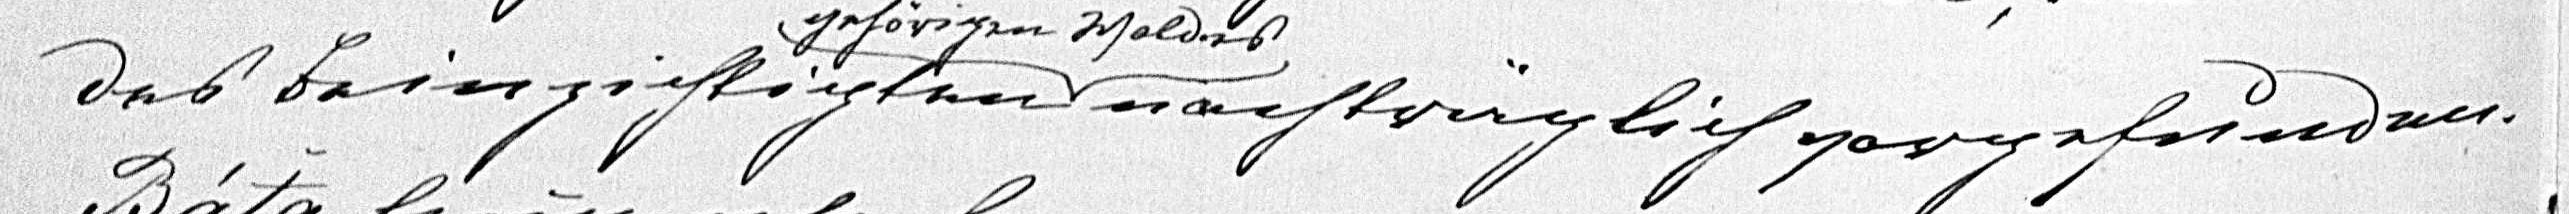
des Bein zichtigten nach träglich vorgefunden.
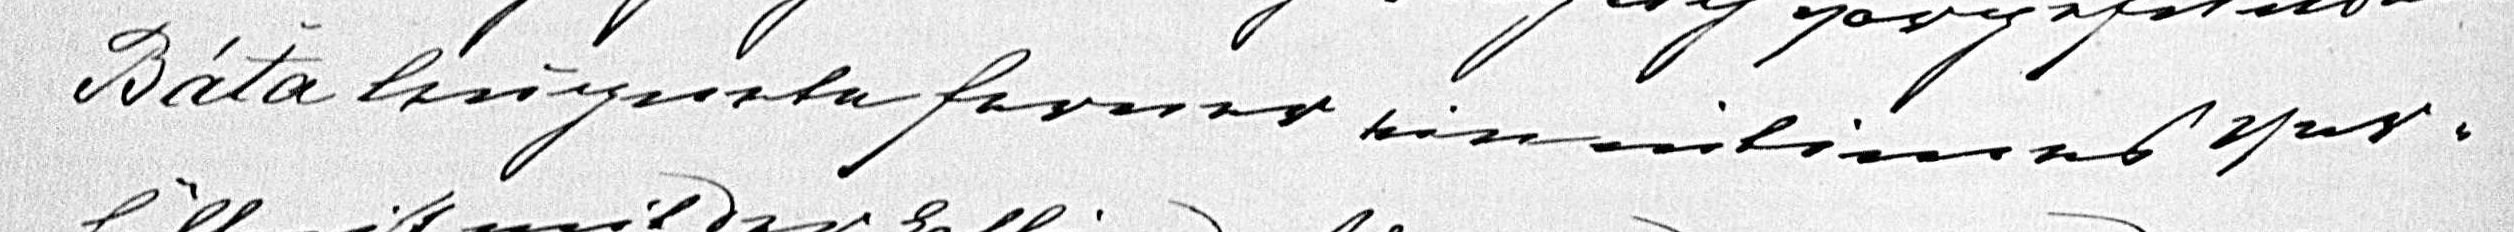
Báta leugnete ferner ein intimes Ver¬
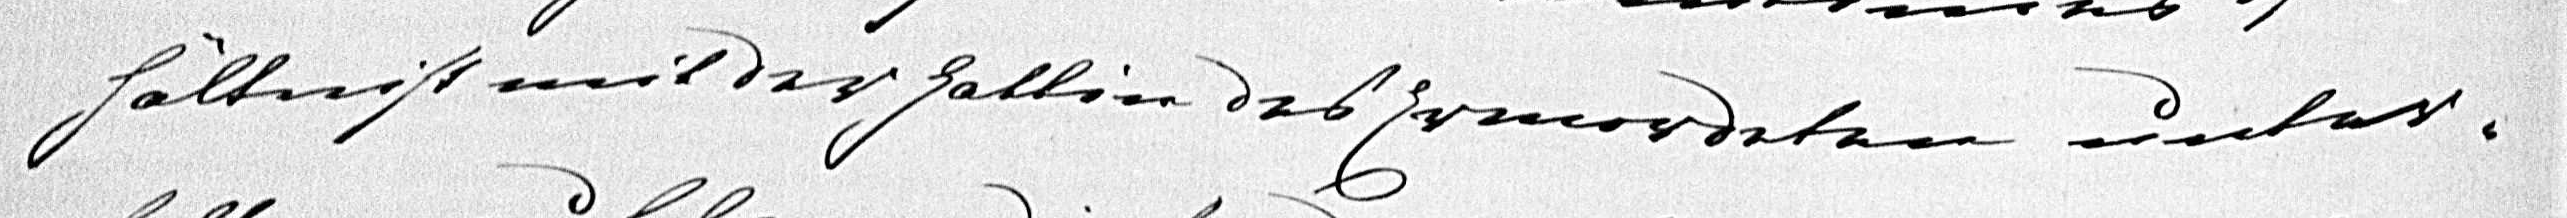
hältniß mit der Zathin des Ermordeten unter¬
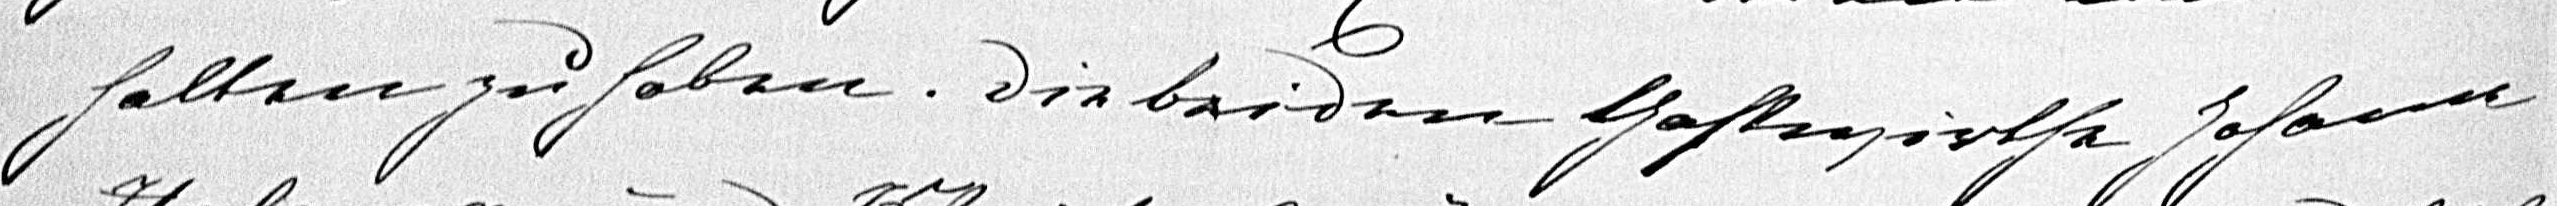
halten zu haben. Die beiden Gastwirthe Johann
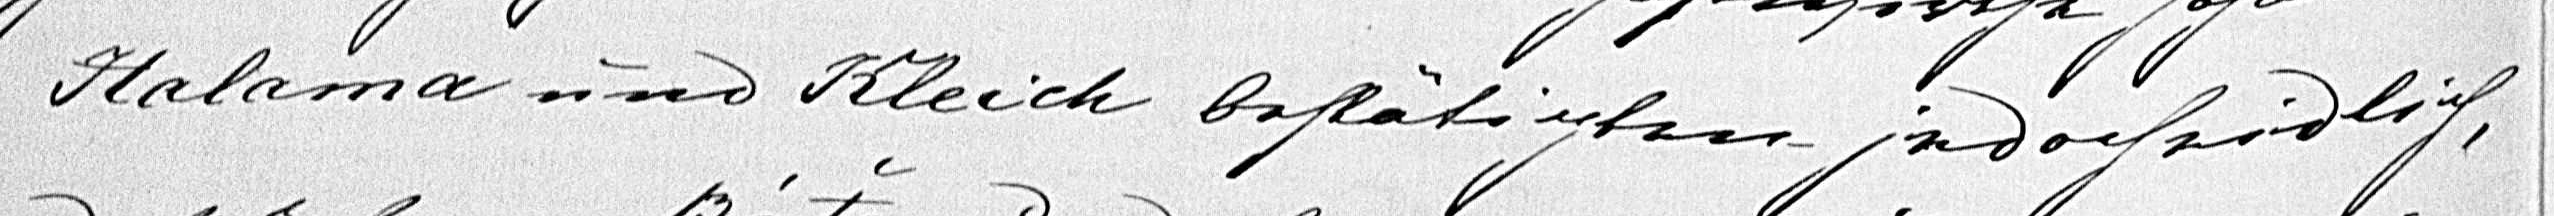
Halama und Kleich bestätigten jedoch eidlich,
